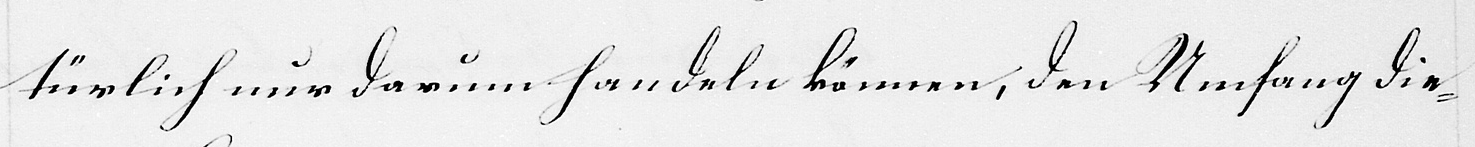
türlich nur darum handeln können, den Umfang die¬
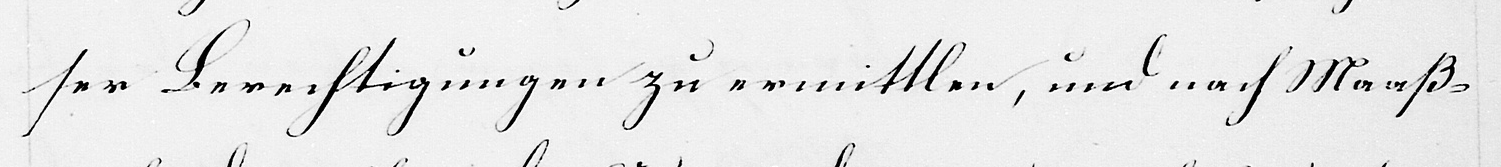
ser Berechtigungen zu ermittlen, und nach Maaß¬
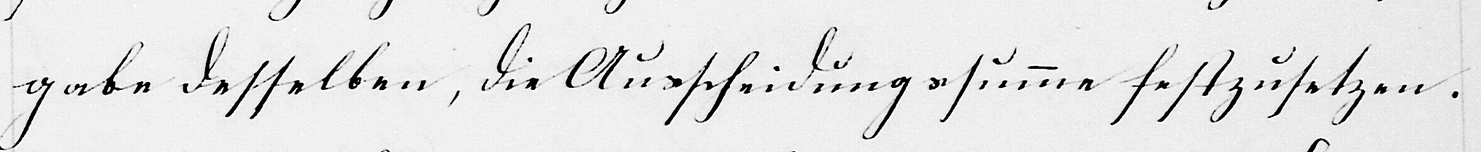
gabe desselben, die Ausscheidungssumme festzusetzen.
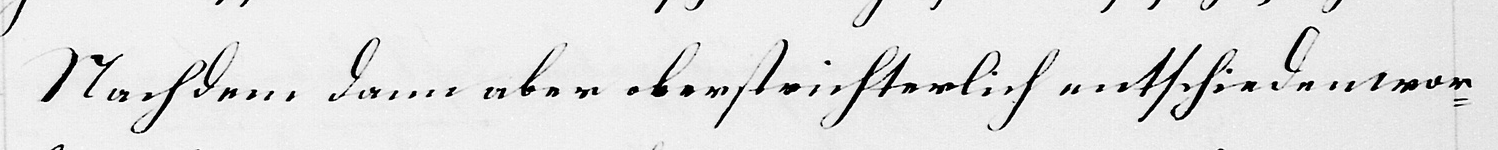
Nachdem dann aber oberstrichterlich entschieden wor¬
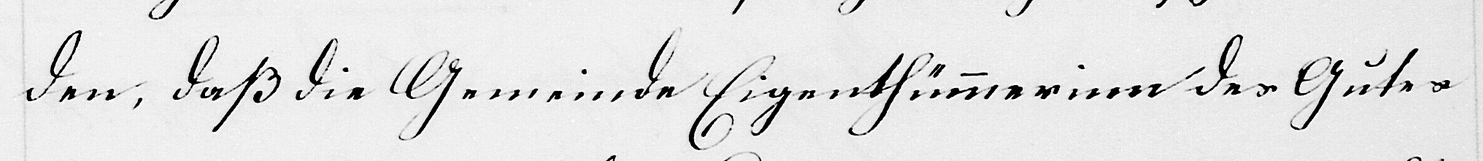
den, daß die Gemeinde Eigenthümmerinn des Gutes
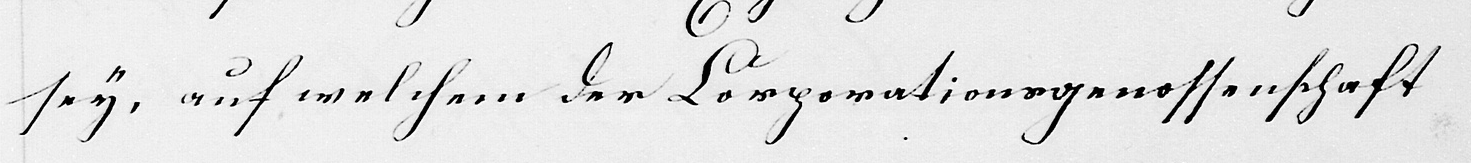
sey, auf welchem der Corporationsgenossenschaft
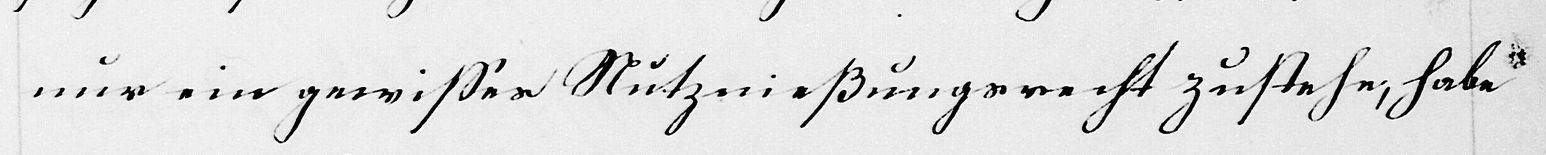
nur ein gewißes Nutznießungsrecht zustehe, habe
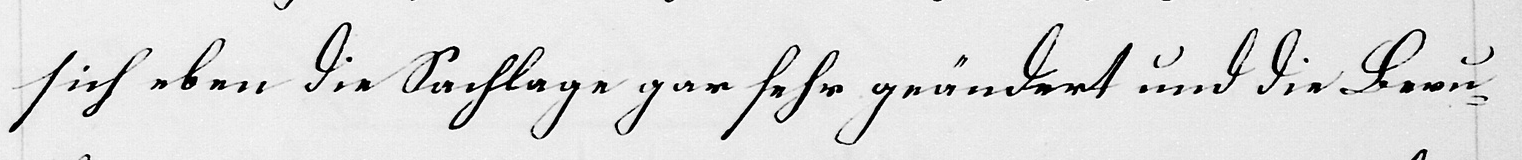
sich eben die Sachlage gar sehr geändert und die Beru¬
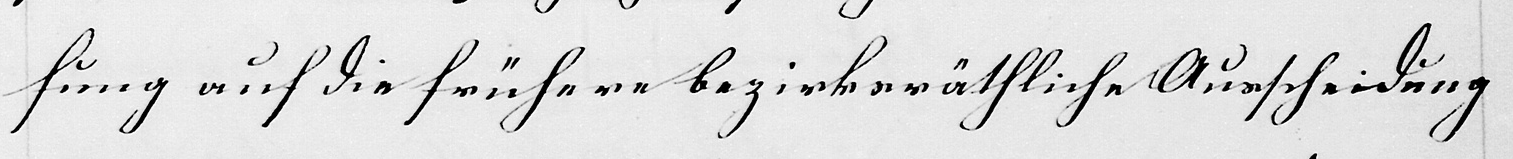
fung auf die frühere bezirksräthliche Ausscheidung
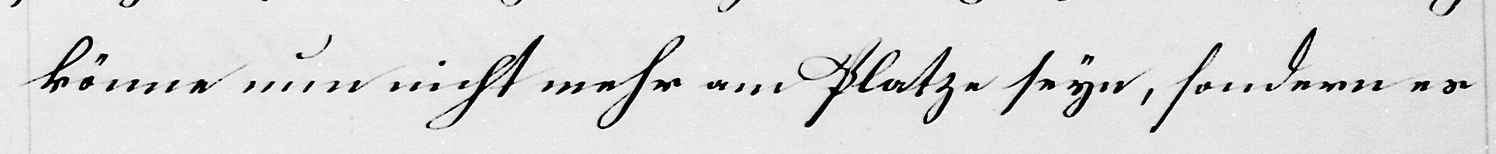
könne nun nicht mehr am Platze seyn, sondern es
